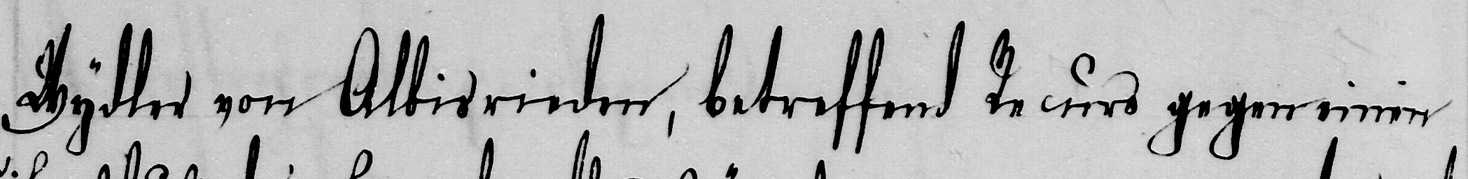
Wydler von Albisrieden, betreffend Recurs gegen einen
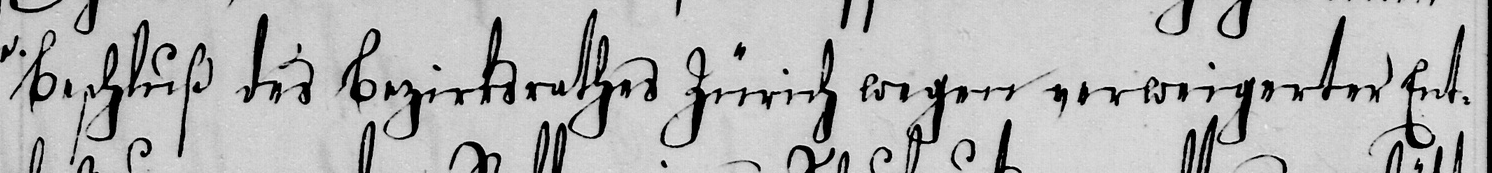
Beschluß des Bezirksrathes Zürich wegen verweigerter Ent¬
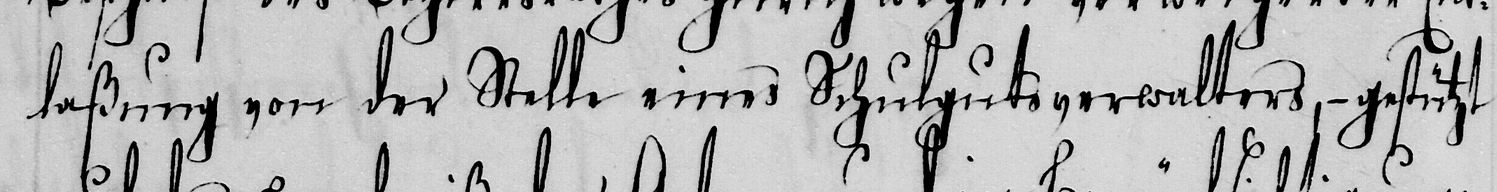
laßung von der Stelle eines Schulgutsverwalters, – gestützt
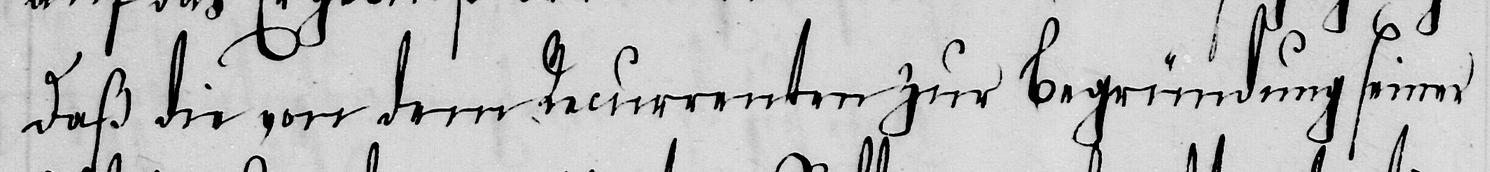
Daß die von dem Recurrenten zur Begründung seiner
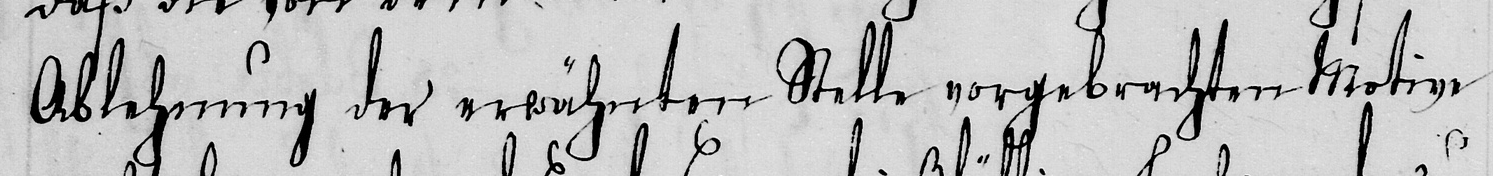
Ablehnung der erwähnten Stelle vorgebrachten Motive
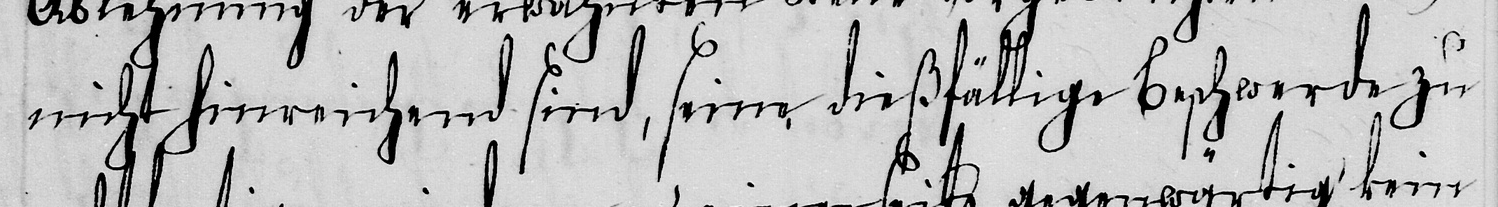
nicht hinreichend sind, seine dießfällige Beschwerde zu
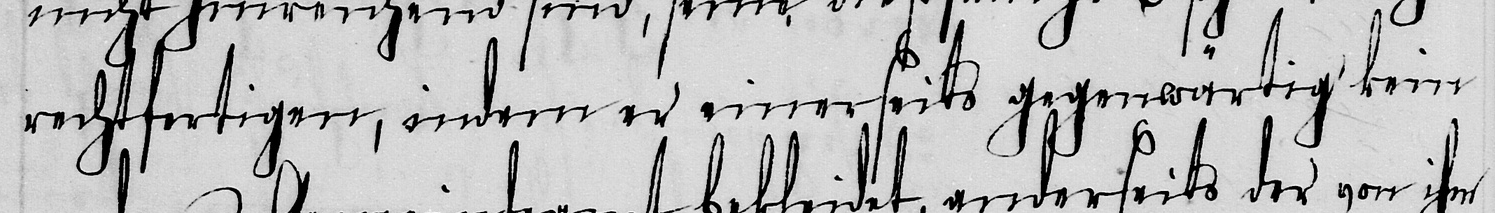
rechtfertigen, indem er einerseits gegenwärtig kein
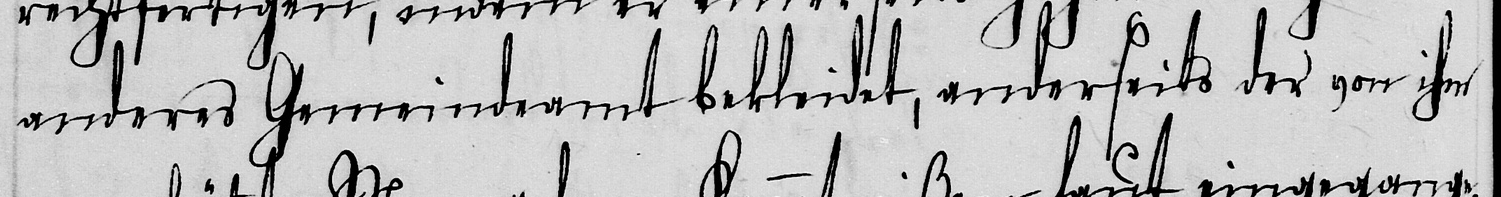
anderes Gemeindeamt bekleidet, anderseits der von ihm
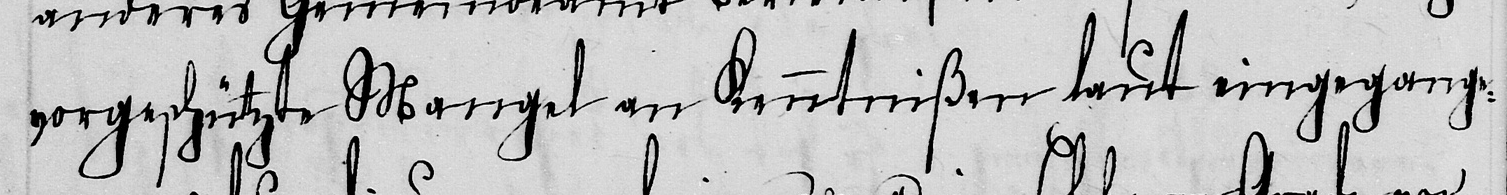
vorgeschützte Mangel an Kenntnißen laut eingegange¬
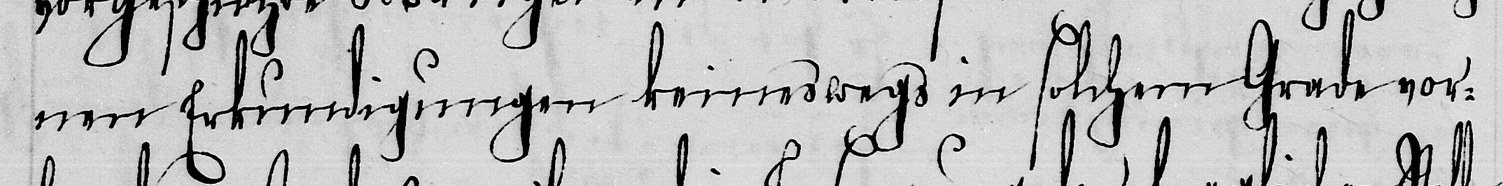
nen Erkundigungen keineswegs in solchem Grade vor¬
